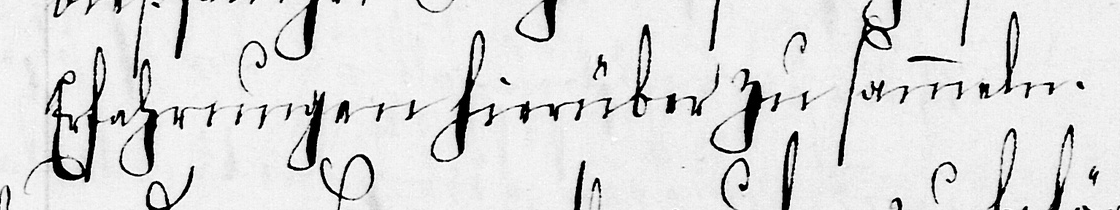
Erfahrungen hierüber zu sammeln.
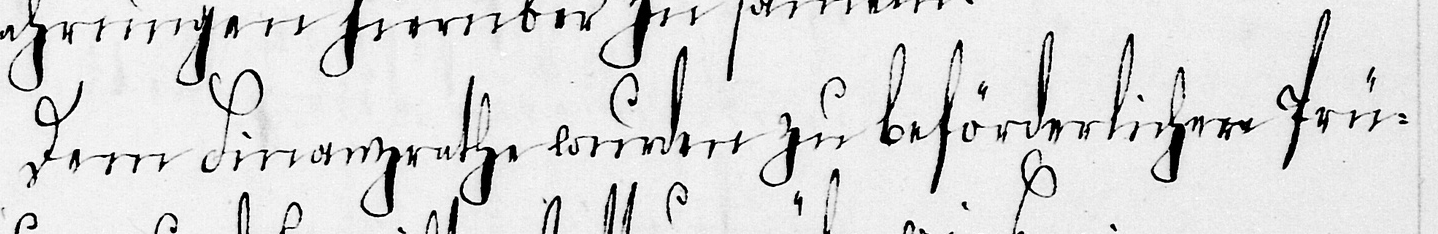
Dem Finanzrathe wurden zu beförderlicher Prü¬
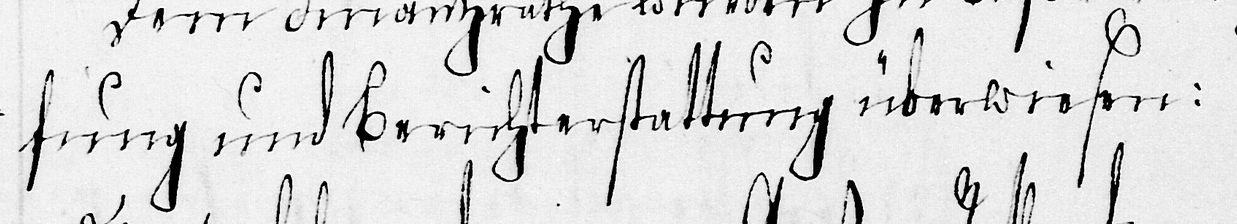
fung und Berichterstattung überwiesen:
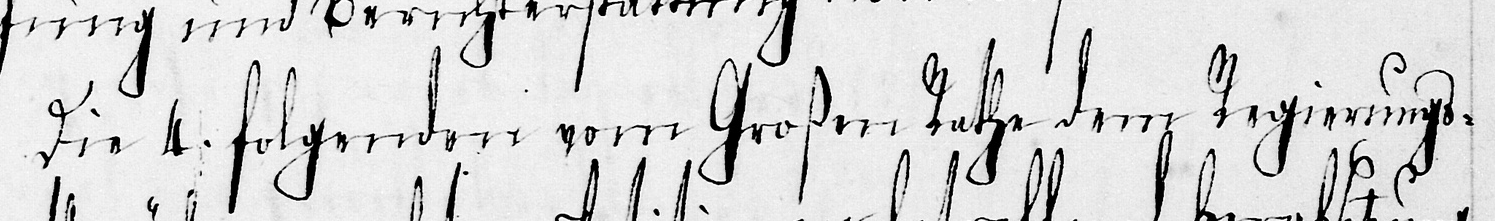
Die 4. folgenden vom Großen Rathe dem Regierungs¬
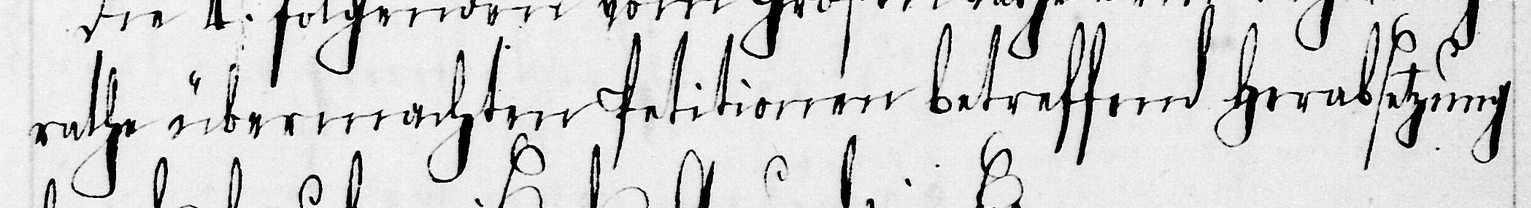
rathe übermachten Petitionen betreffend Herabsetzung
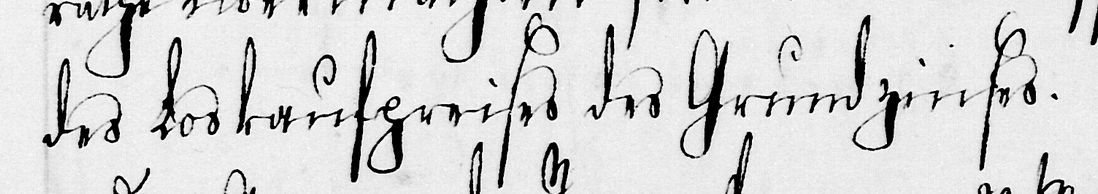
des Loskaufpreises des Grundzinses.
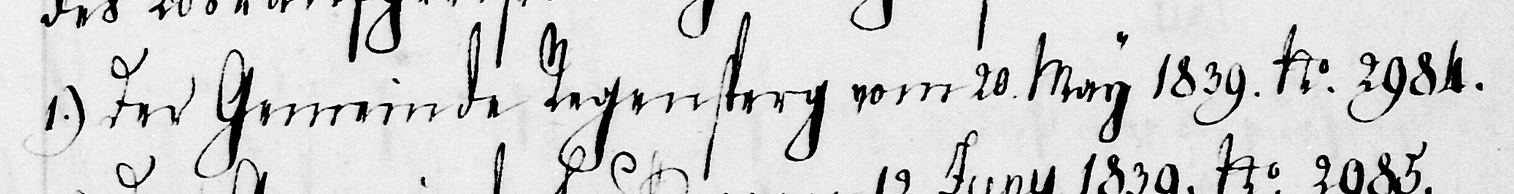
1.) Der Gemeinde Regensperg vom 20. May 1839. No. 2984.
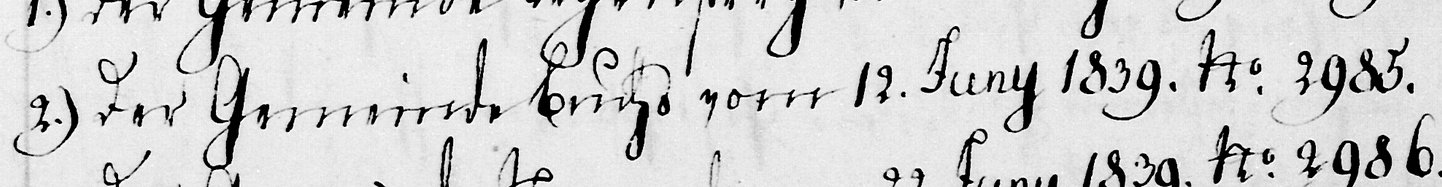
2.) Der Gemeinde Buchs vom 12. Juny 1839. No. 2985.
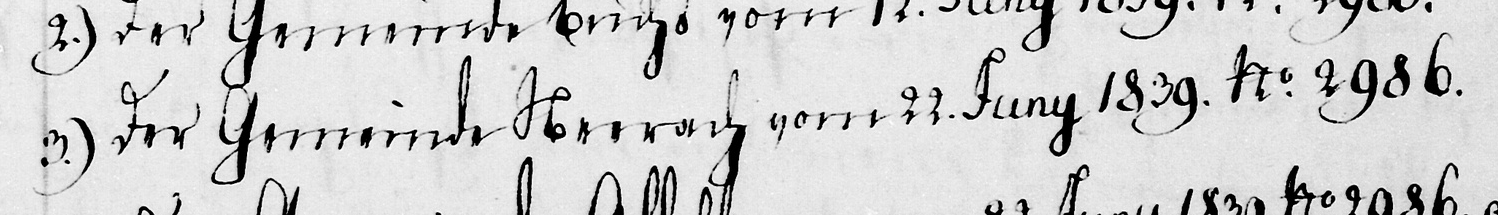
3.) Der Gemeinde Neerach vom 22. Juny 1839. No. 2986.
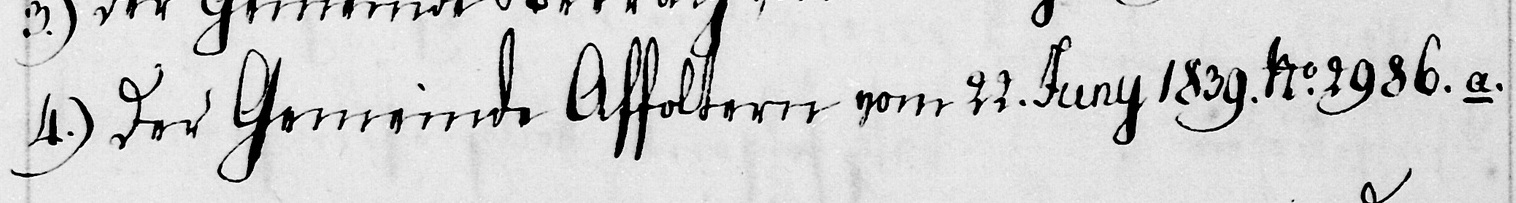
4.) Der Gemeinde Affoltern vom 22. Juny 1839. No. 2986. a.
